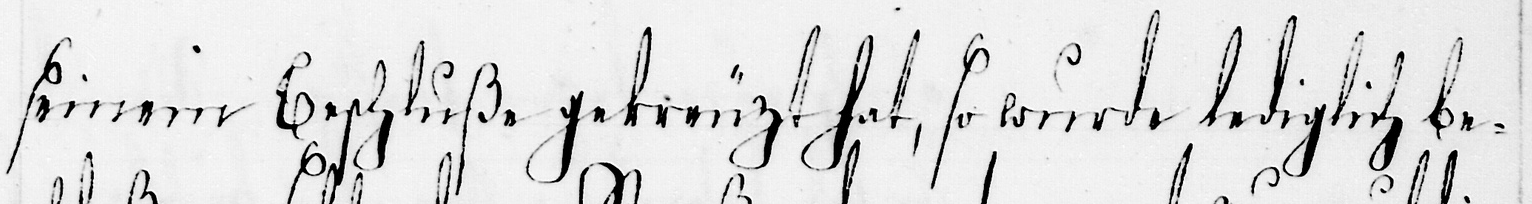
seinem Beschluße gekreuzt hat, so wurde lediglich b¬
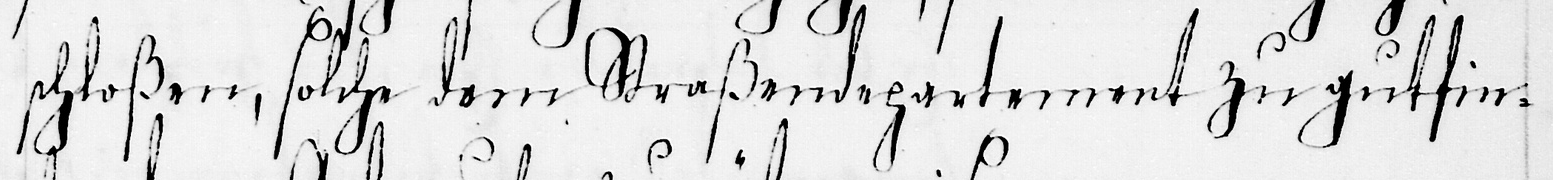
schloßen, solche dem Straßendepartement zu gutfin¬
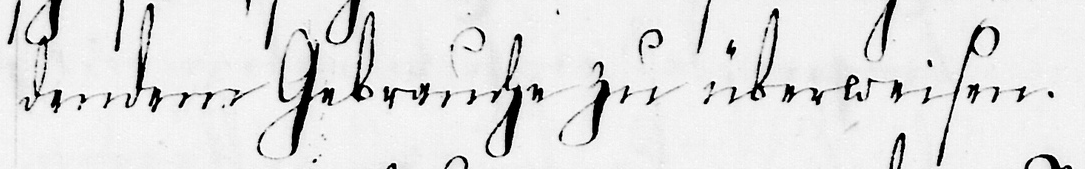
dendem Gebrauche zu überweisen.
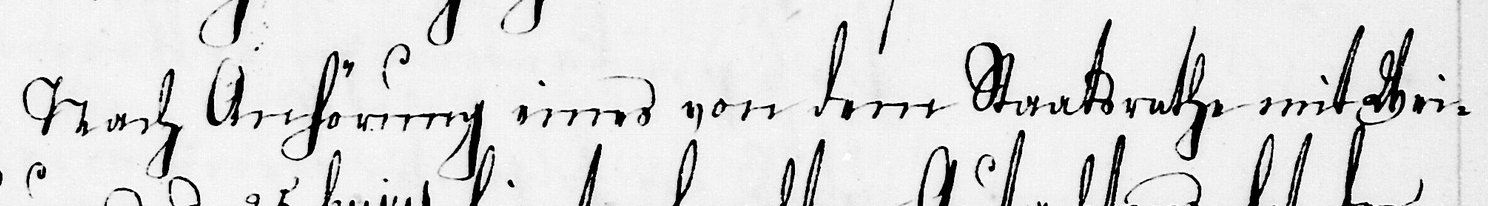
Nach Anhörung eines von dem Staatsrathe mit Wei¬
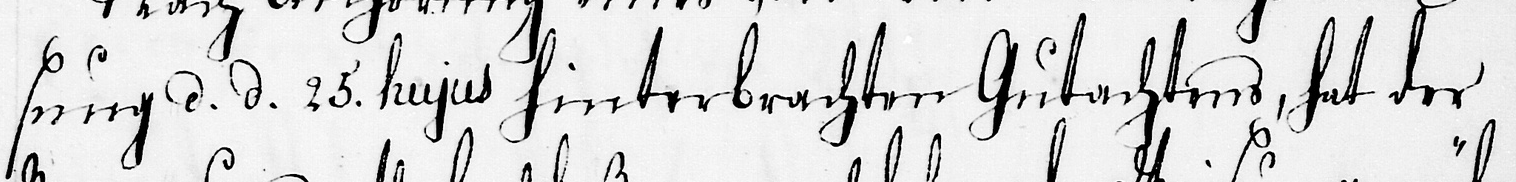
sung d. d. 25. hujus hinterbrachten Gutachtens, hat der
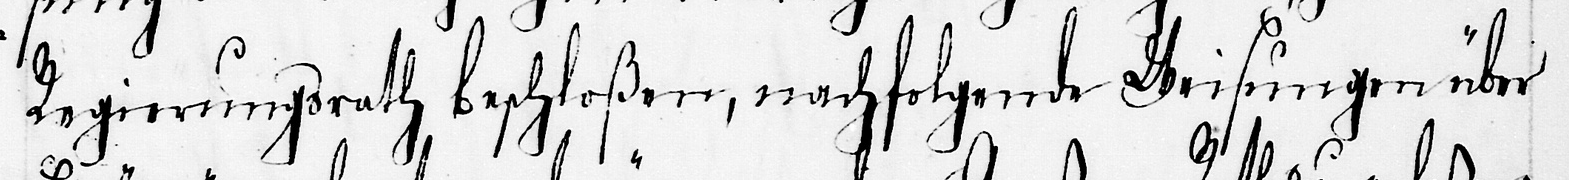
Regierungsrath beschloßen, nachfolgende Weisungen über
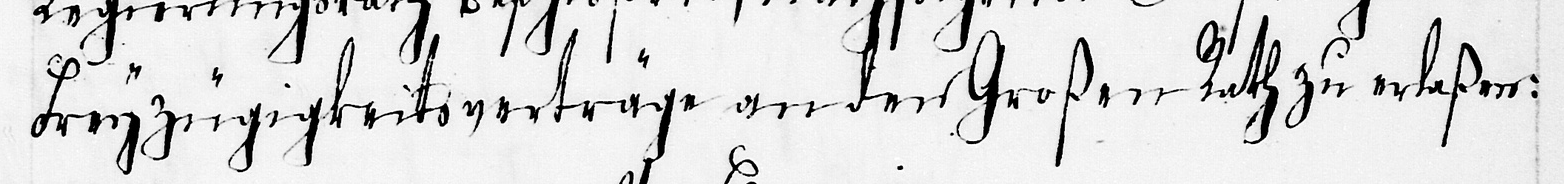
Freyzügigkeitsverträge an den Großen Rath zu erlaßen:
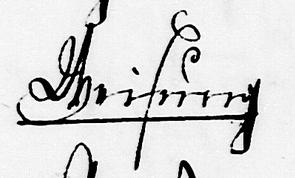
Weisung
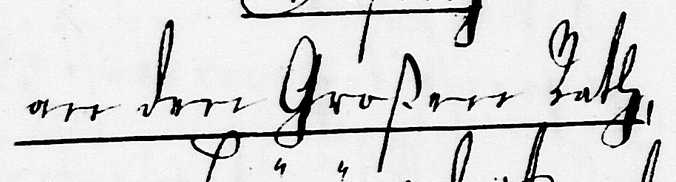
an den Großen Rath,
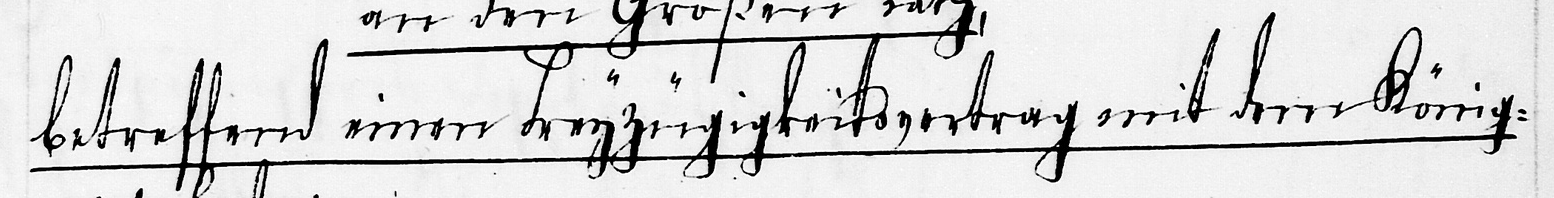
betreffend einen Freyzügigkeitsvertrag mit dem König¬
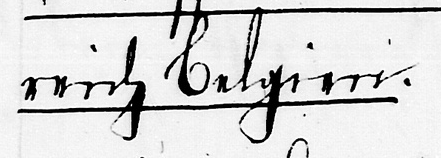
reich Belgien.
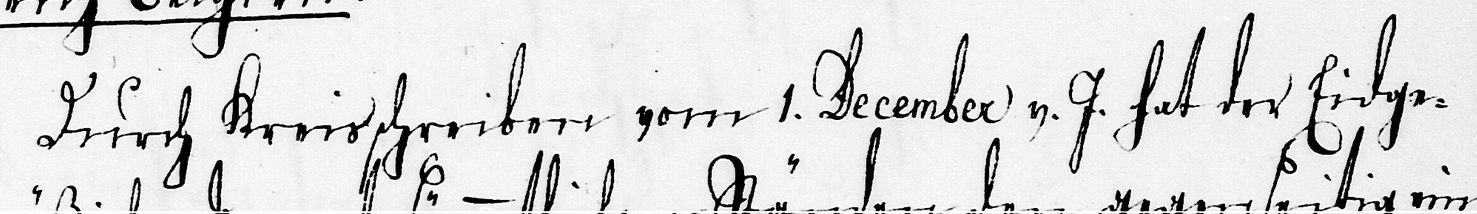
Durch Kreisschreiben vom 1. December v. J. hat der Eidge¬
